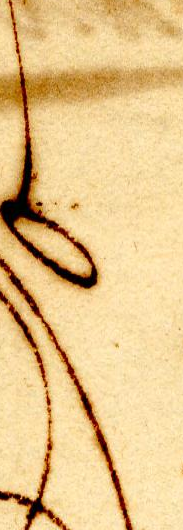To
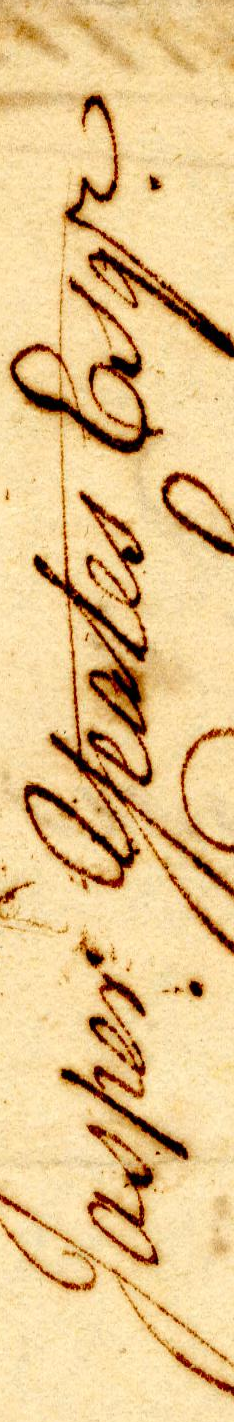Jasper Yeates Esq^r
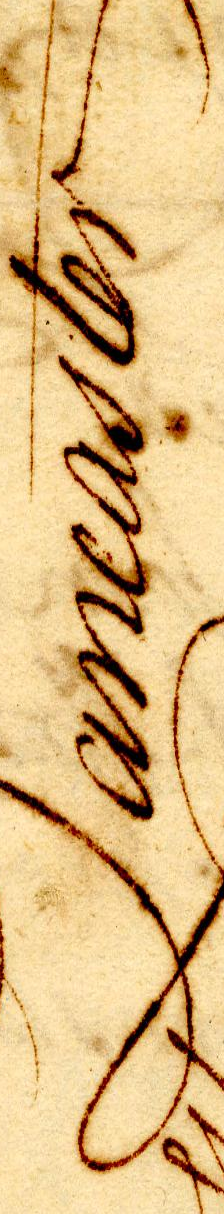Lancaster
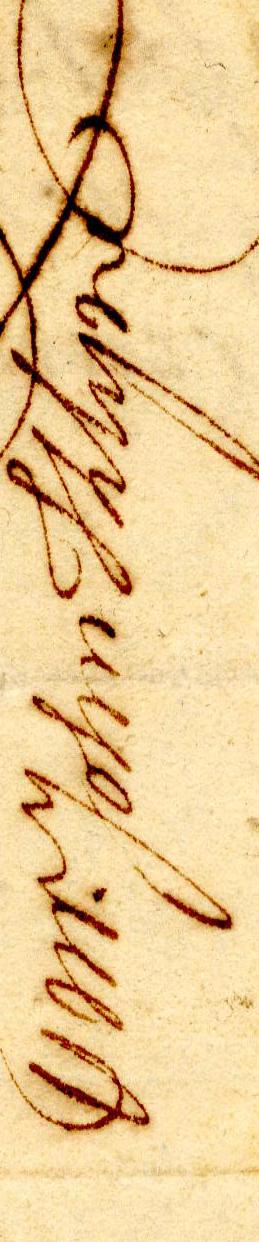Per M^r. John Thlyne
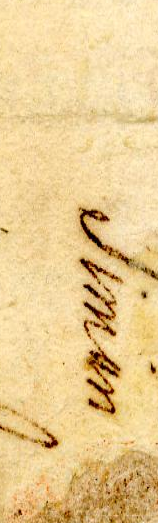Tinian
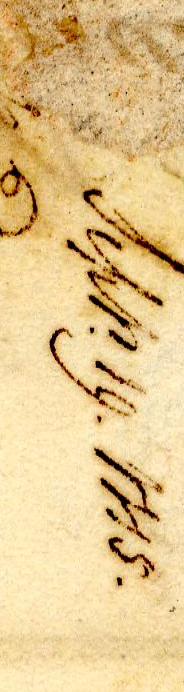Sep^r. 19. 1775.
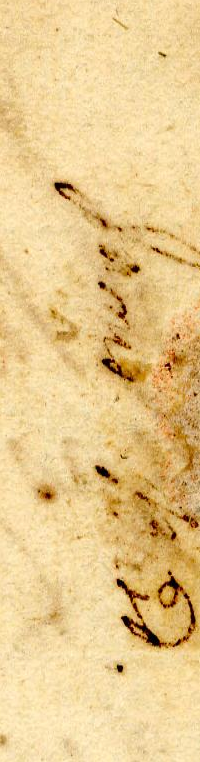James Burd
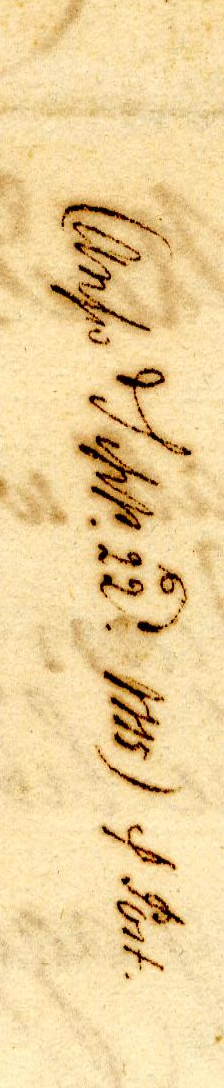(Answ^d Sept^r. 22^d. 1775) Per Post.
